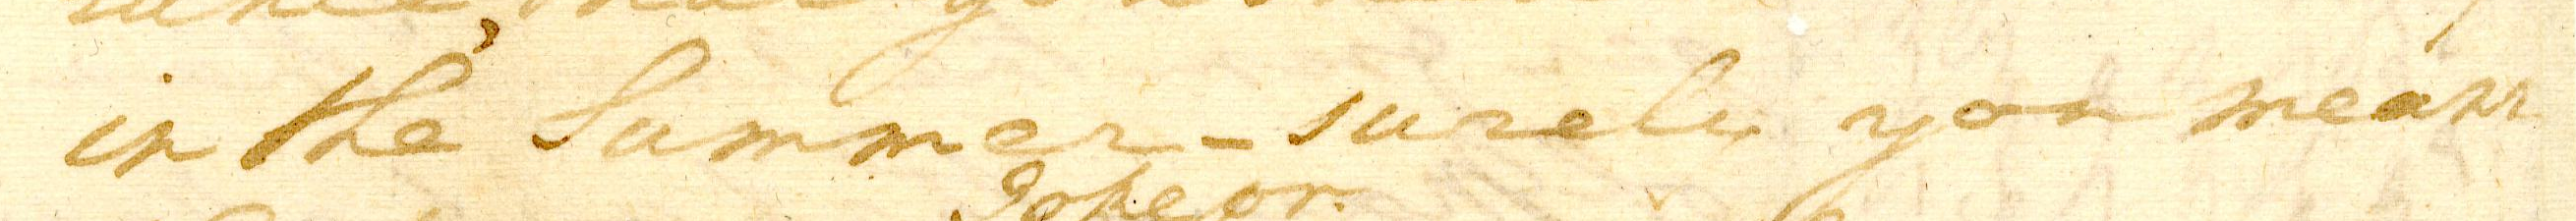in the Summer- surely you mean
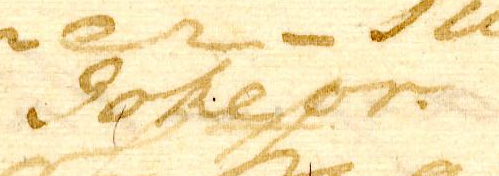Joke or
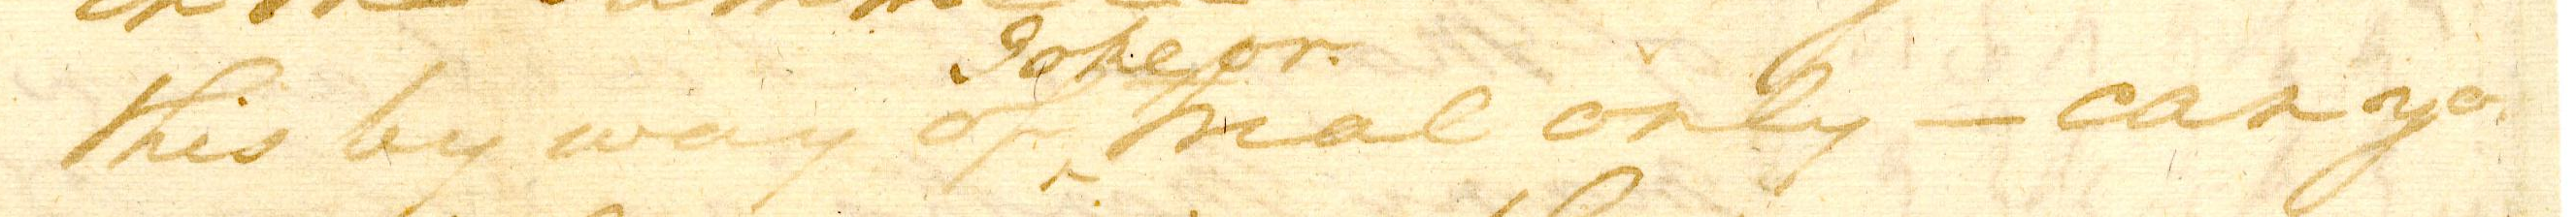this by way of ^ trial only- can you
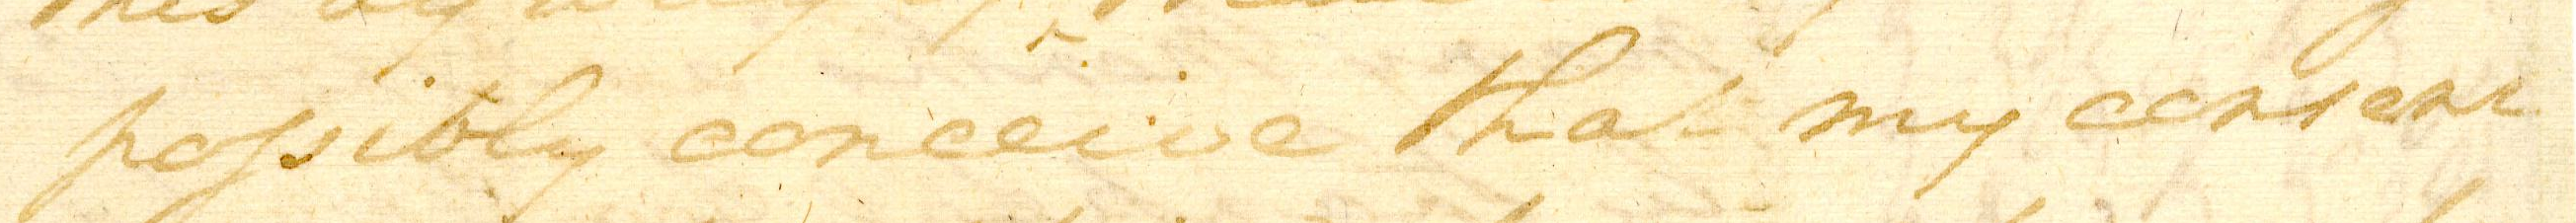possibly conceive that my consent
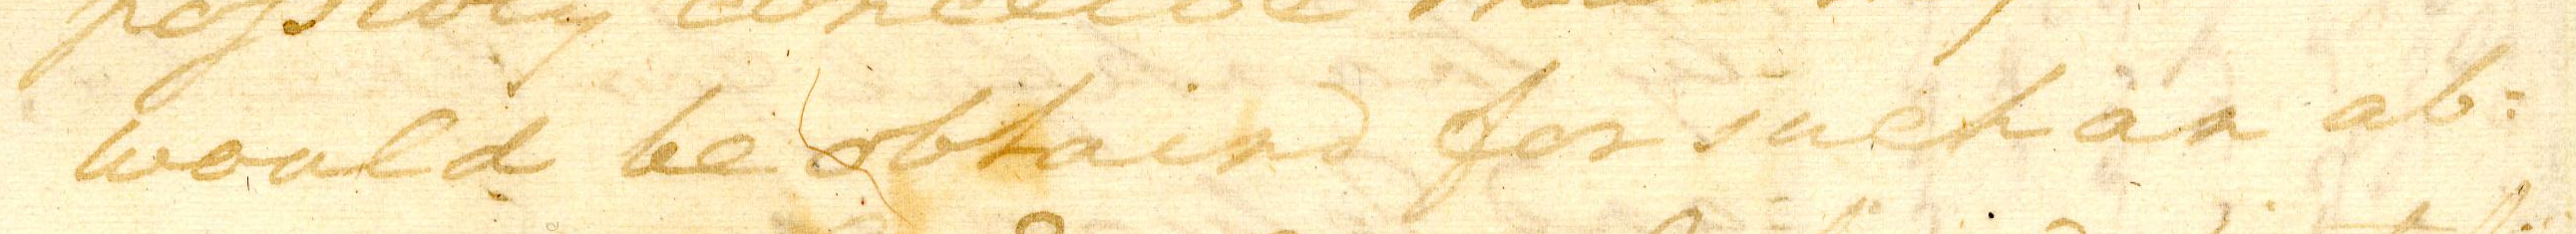would be obtained for such an ab-
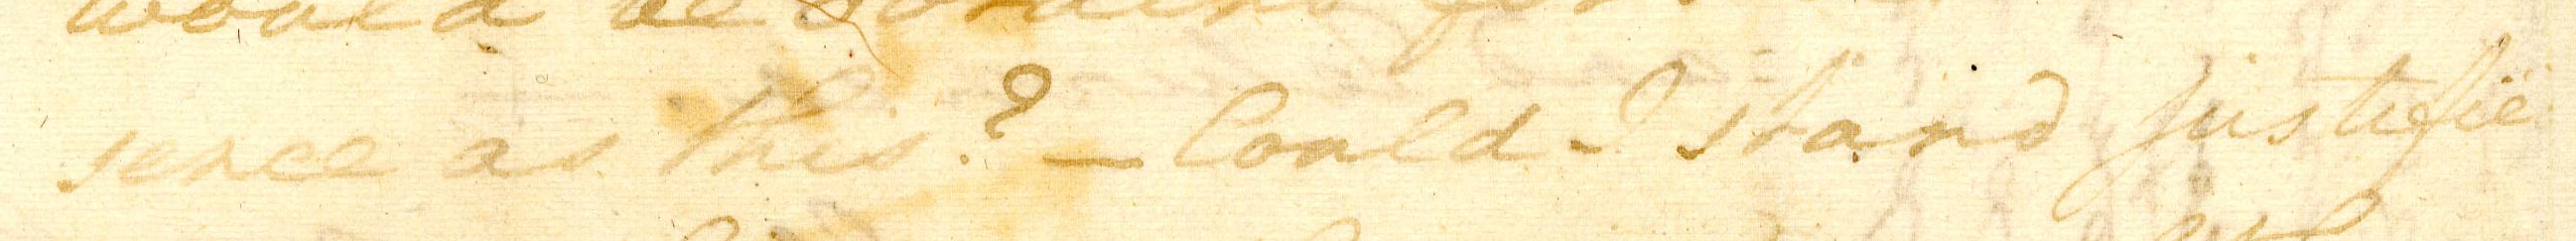sence as this?- Could I stand justifie
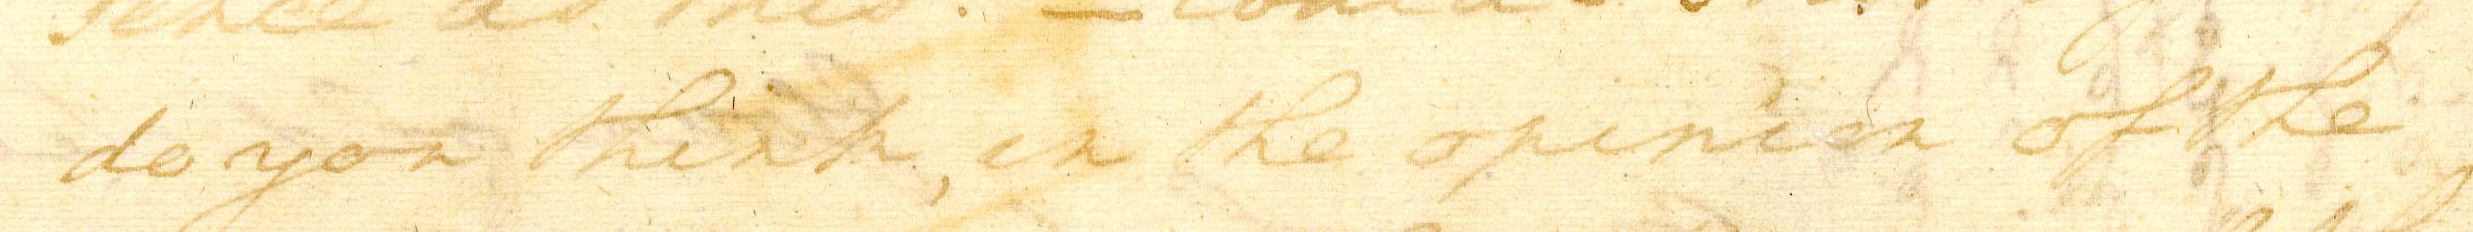do you think, in the opinion of the
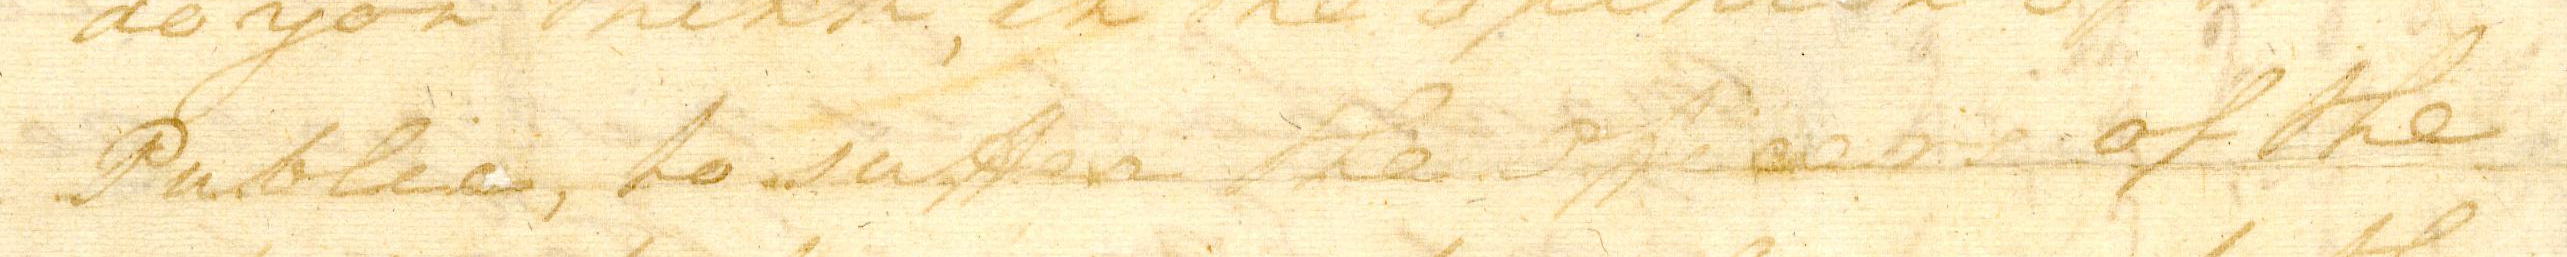Public, to suffer the officers of the
